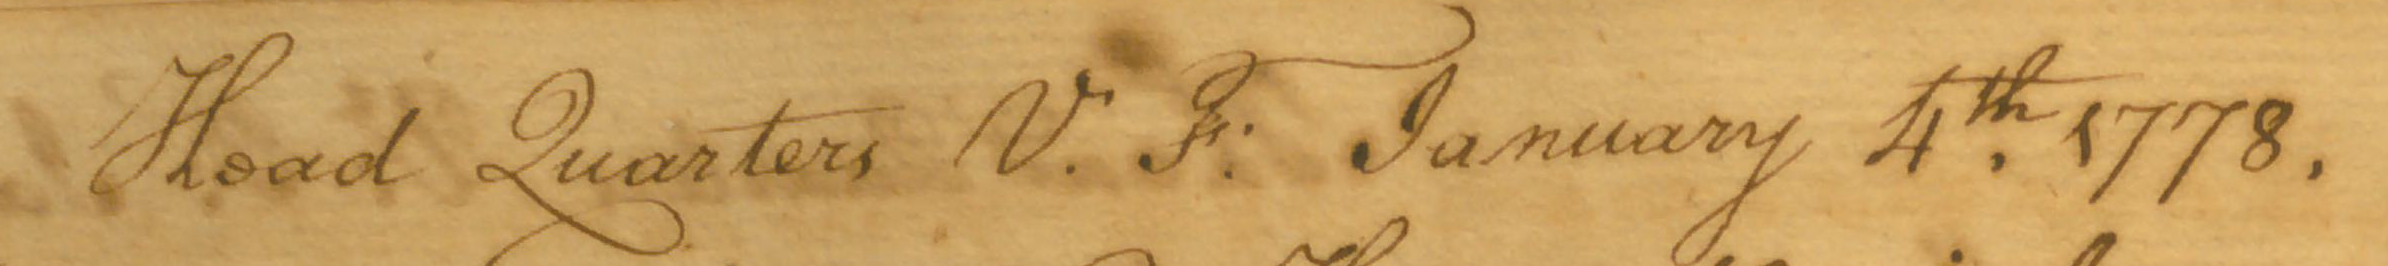Head Quarters V. F: January 4^th. 1778.
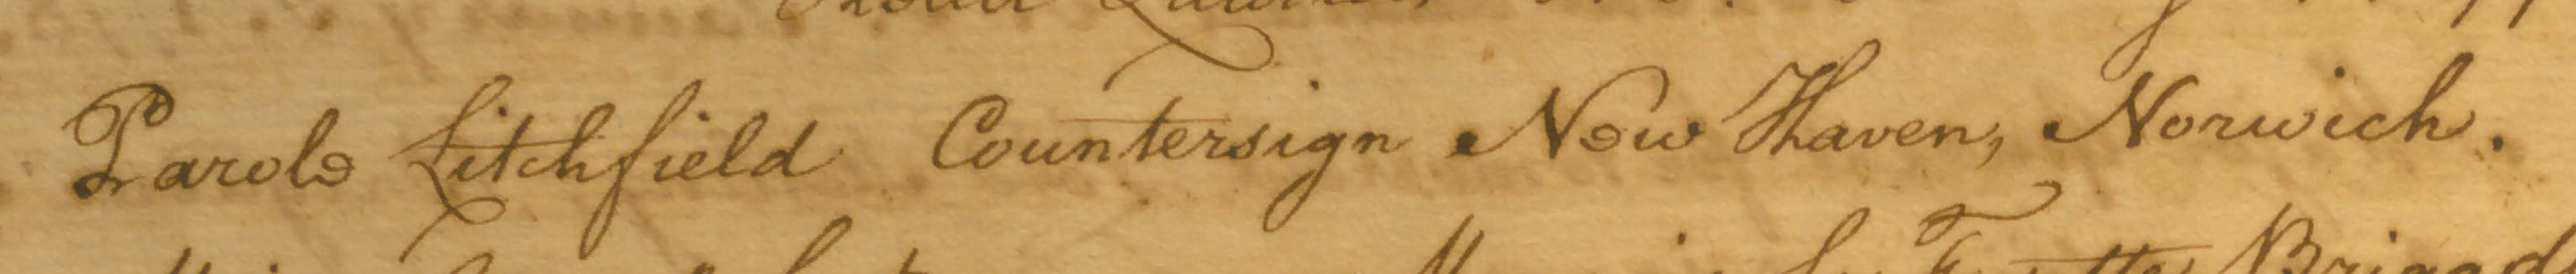Parole Litchfield Countersign New Haven, Norwich.
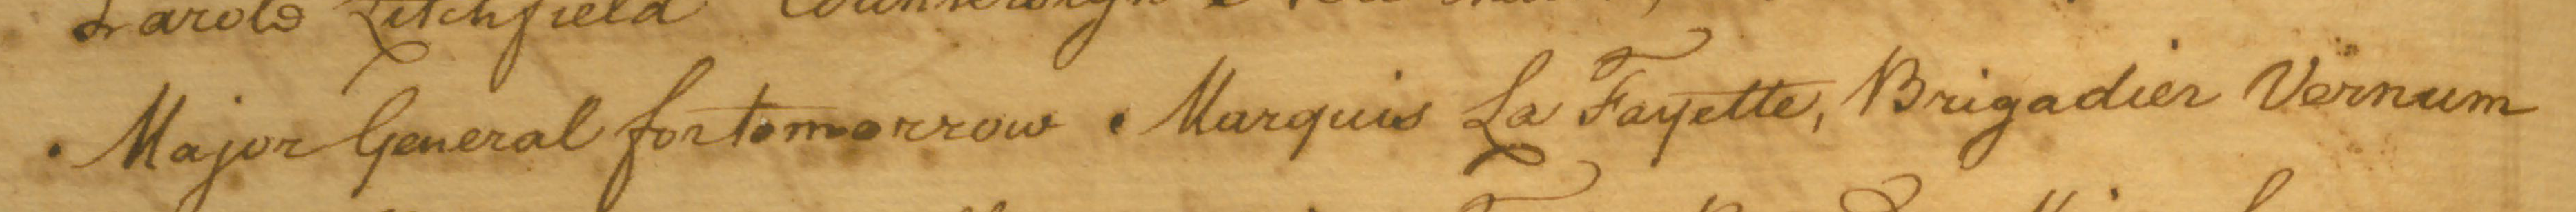Major General for tomorrow Marquis La Fayette, Brigadier Vernum
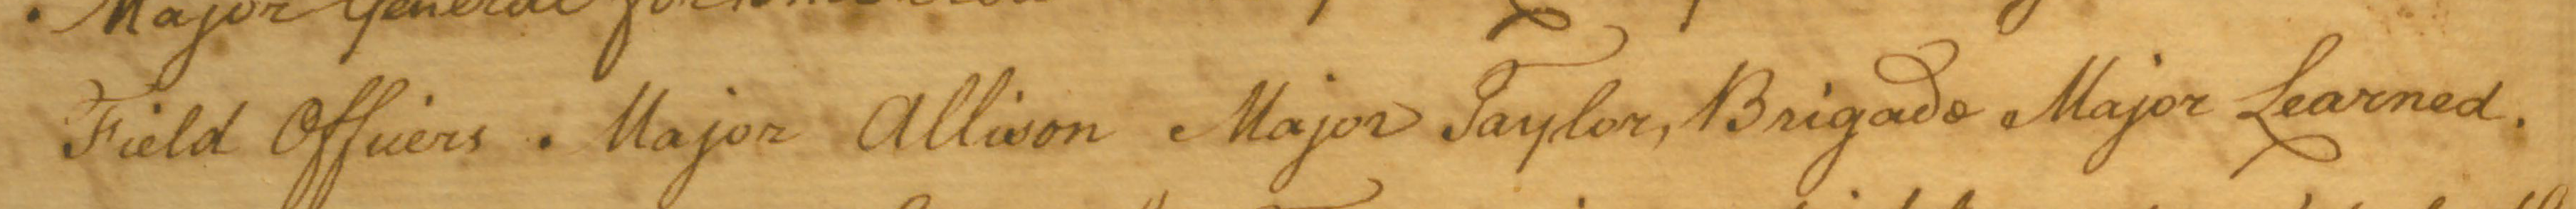Field Officers Major Allison Major Taylor Brigade Major Learned.
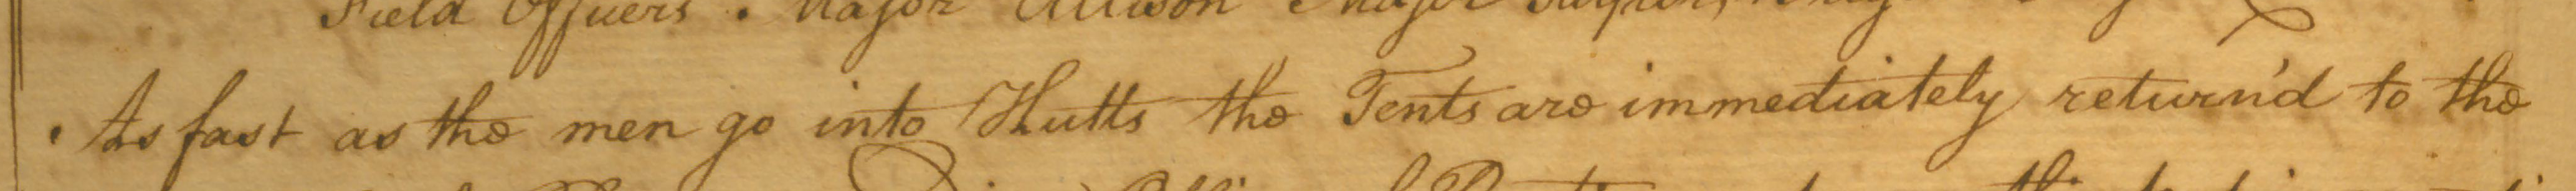As fast as the men go into Hutts the Tents are immediately return'd to the
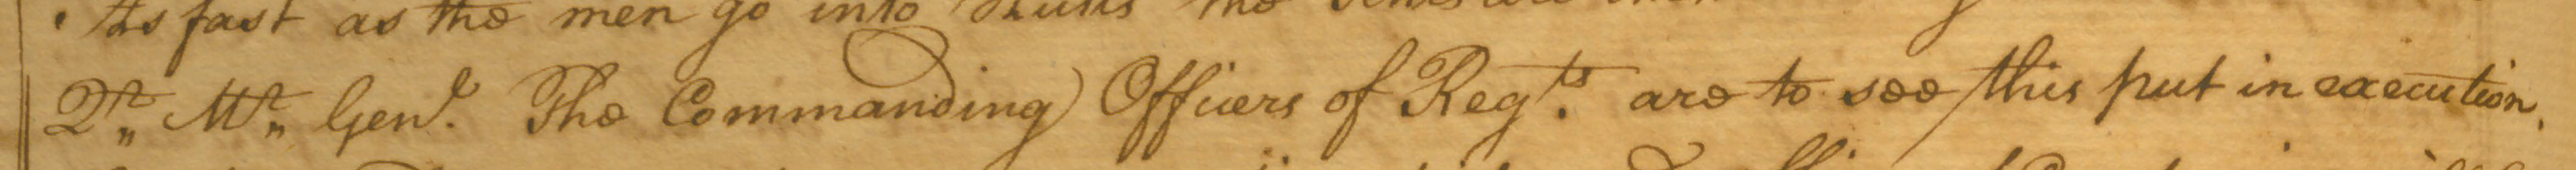Q^r. M^r. Gen^l. The Commanding Officers of Reg^ts. are to see this put in execution.
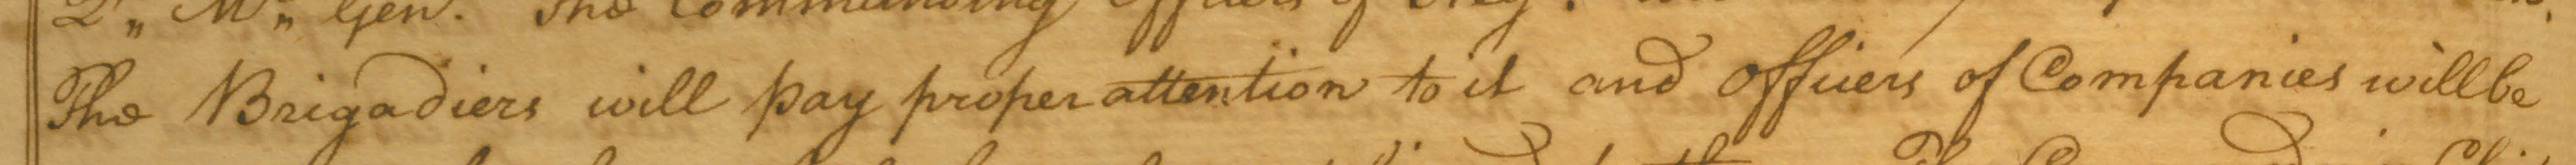The Brigadiers will pay proper attention to it and officers of Companies will be
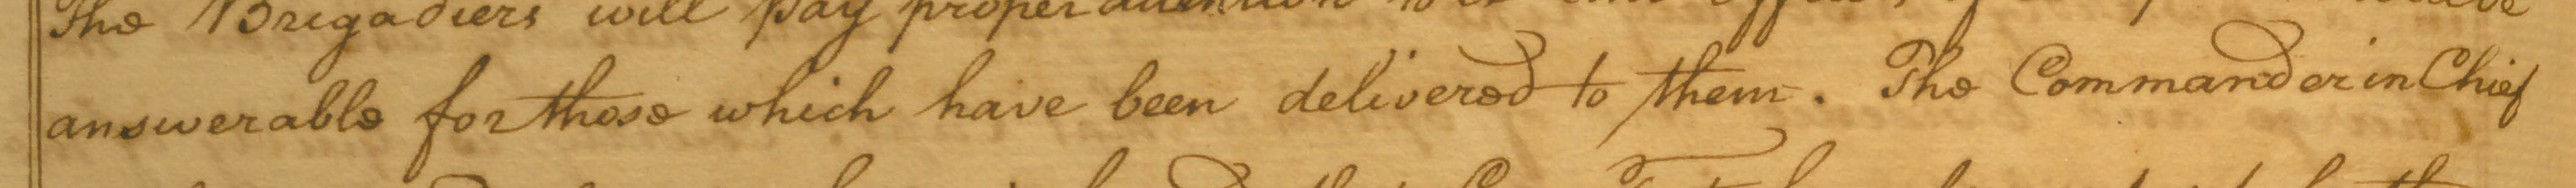answerable for those which have been delivered to them. The Commander in Chief
